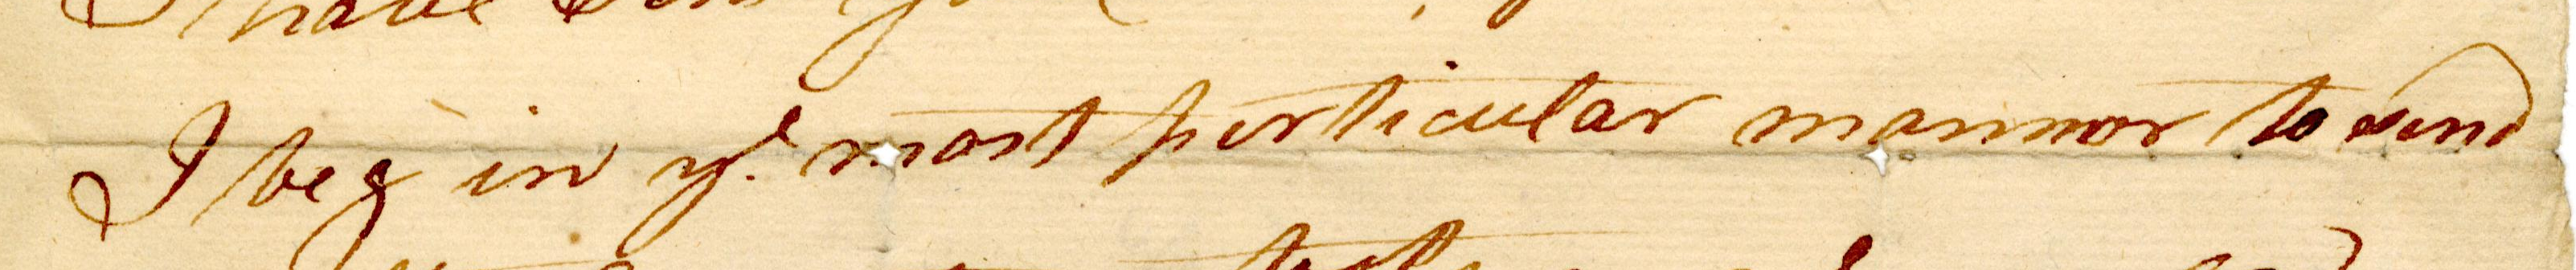I beg in y^e. most particular mannor to send
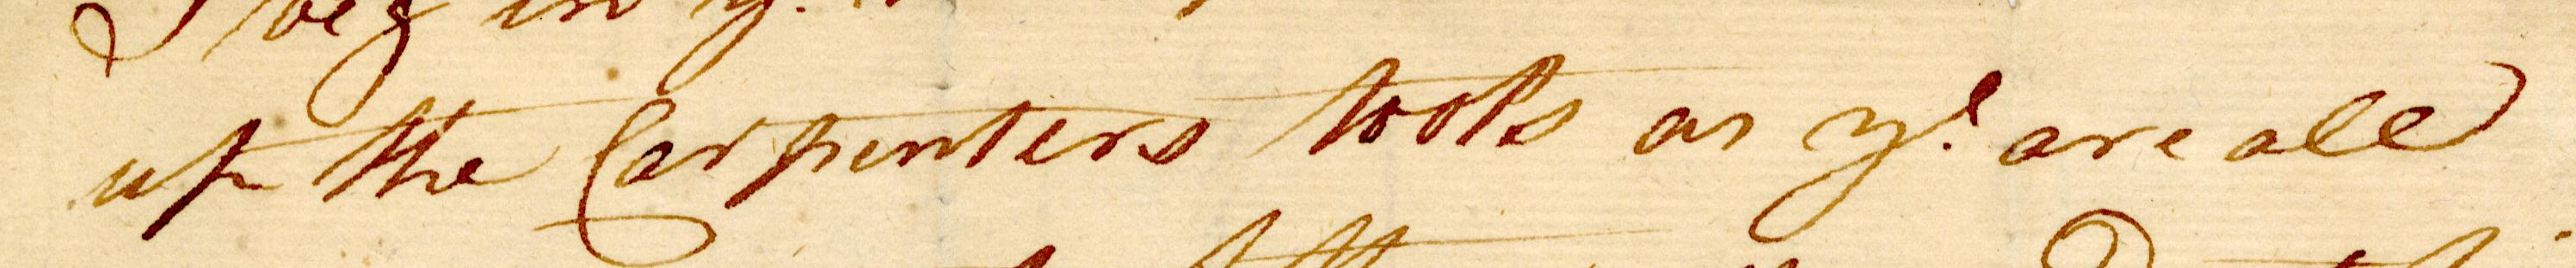up the Carpenters tools as y^e. are all
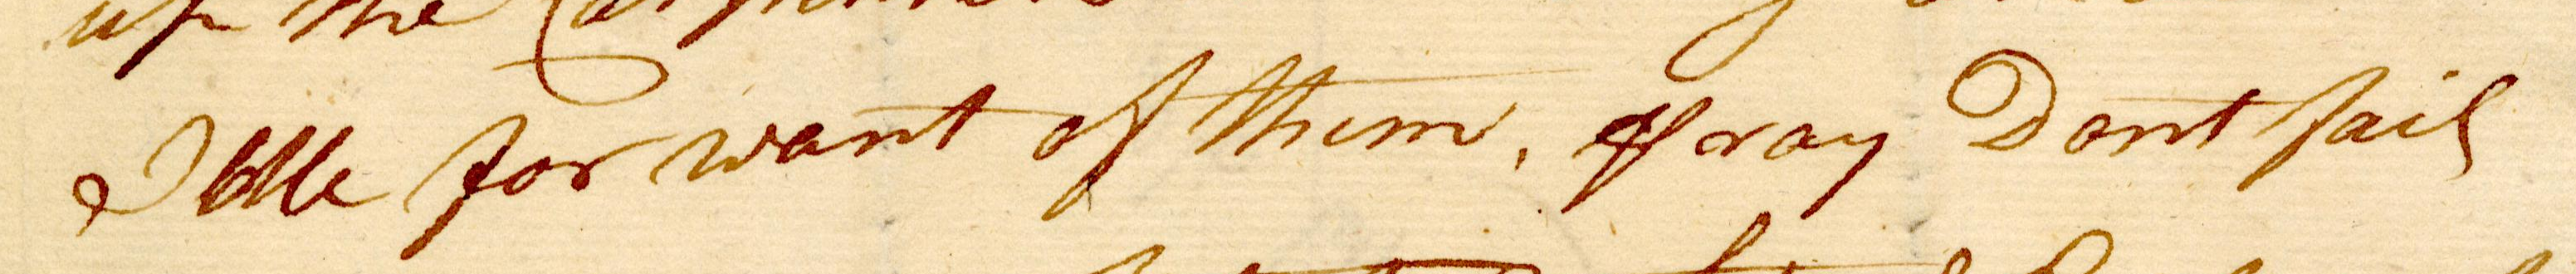Idle for want of them, pray Dont fail
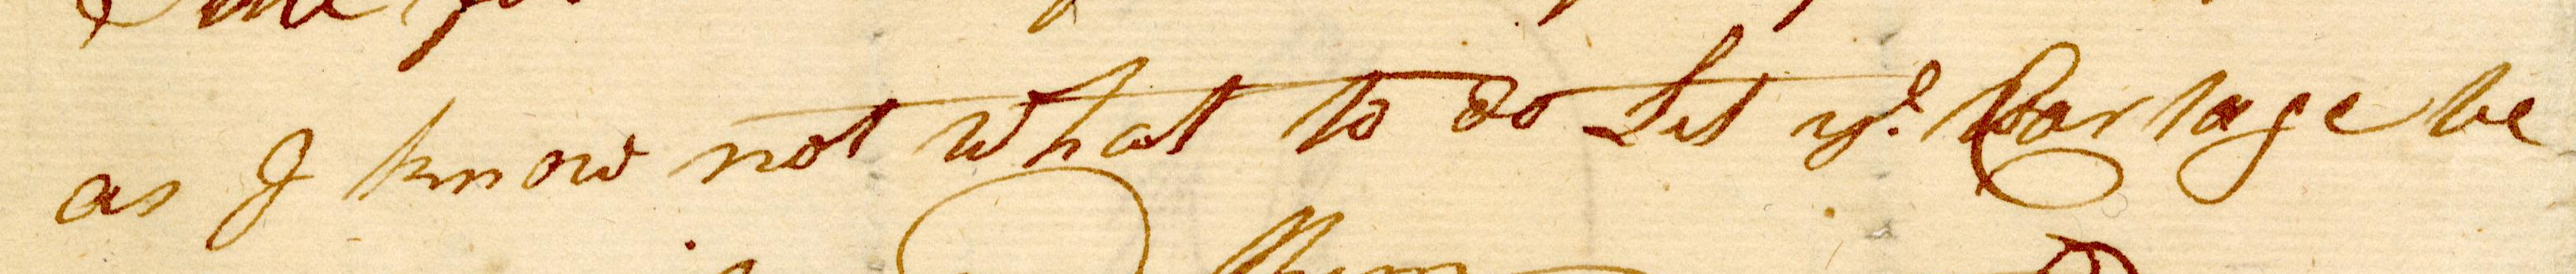as I know not what to do Let y^e. Cartage be
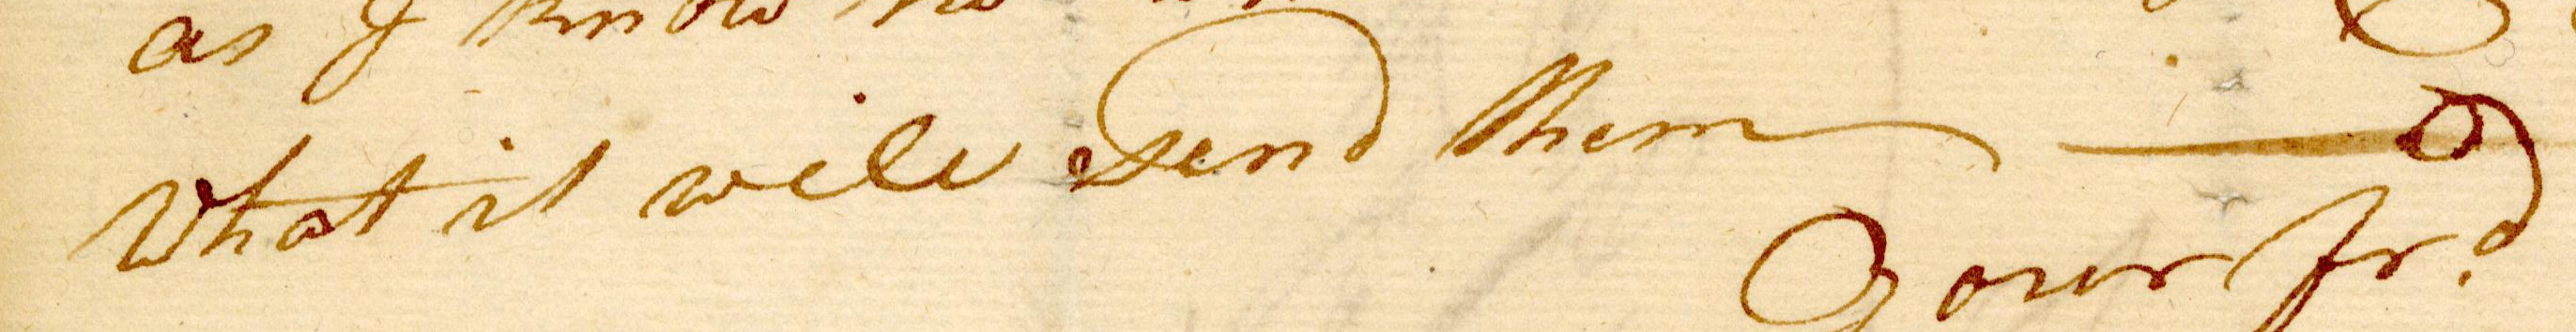what it will send them-
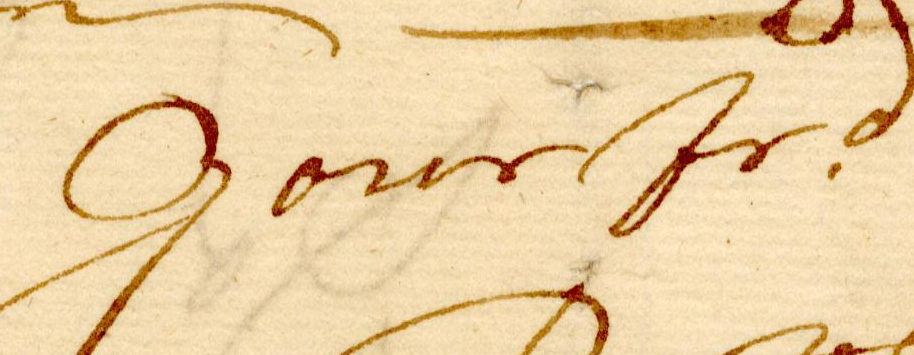Your fr^d
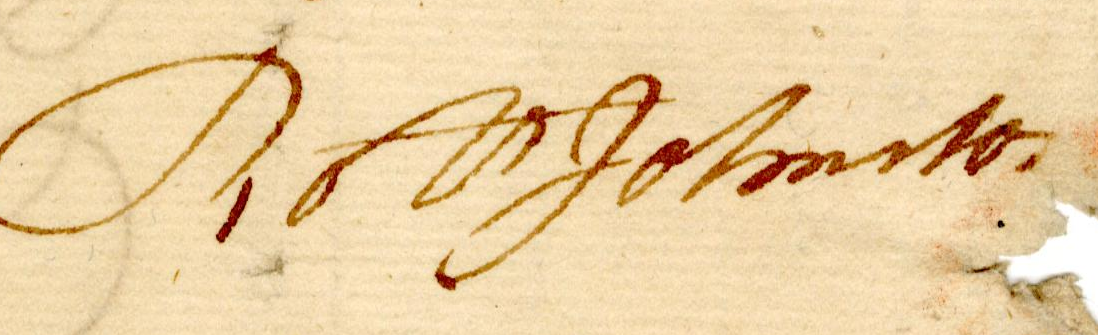Rob^t Johnsto.
